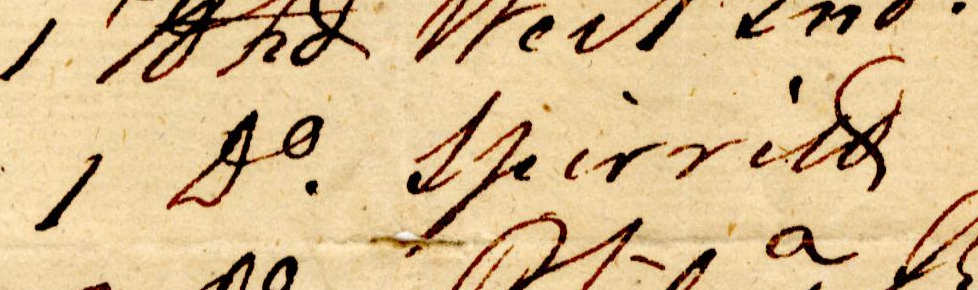1 D^o. Spirrits
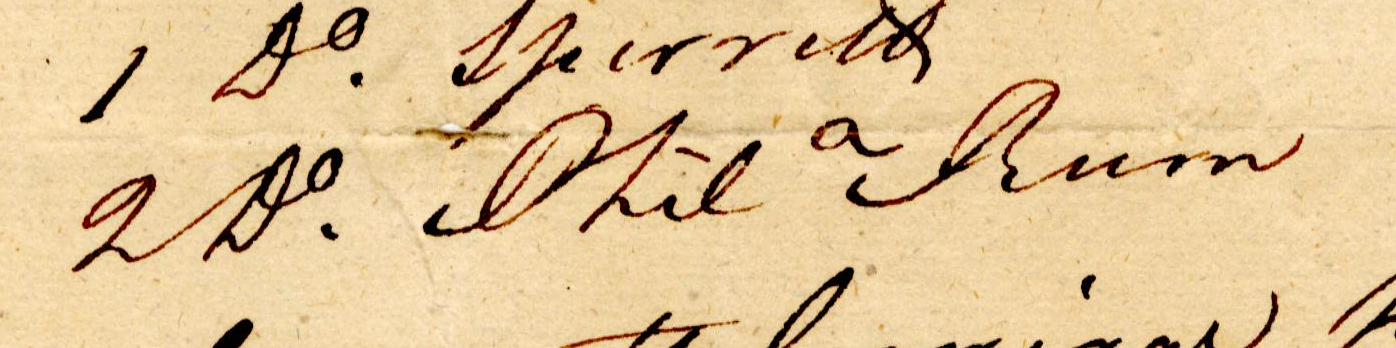2 D^o. Phil^a Rum
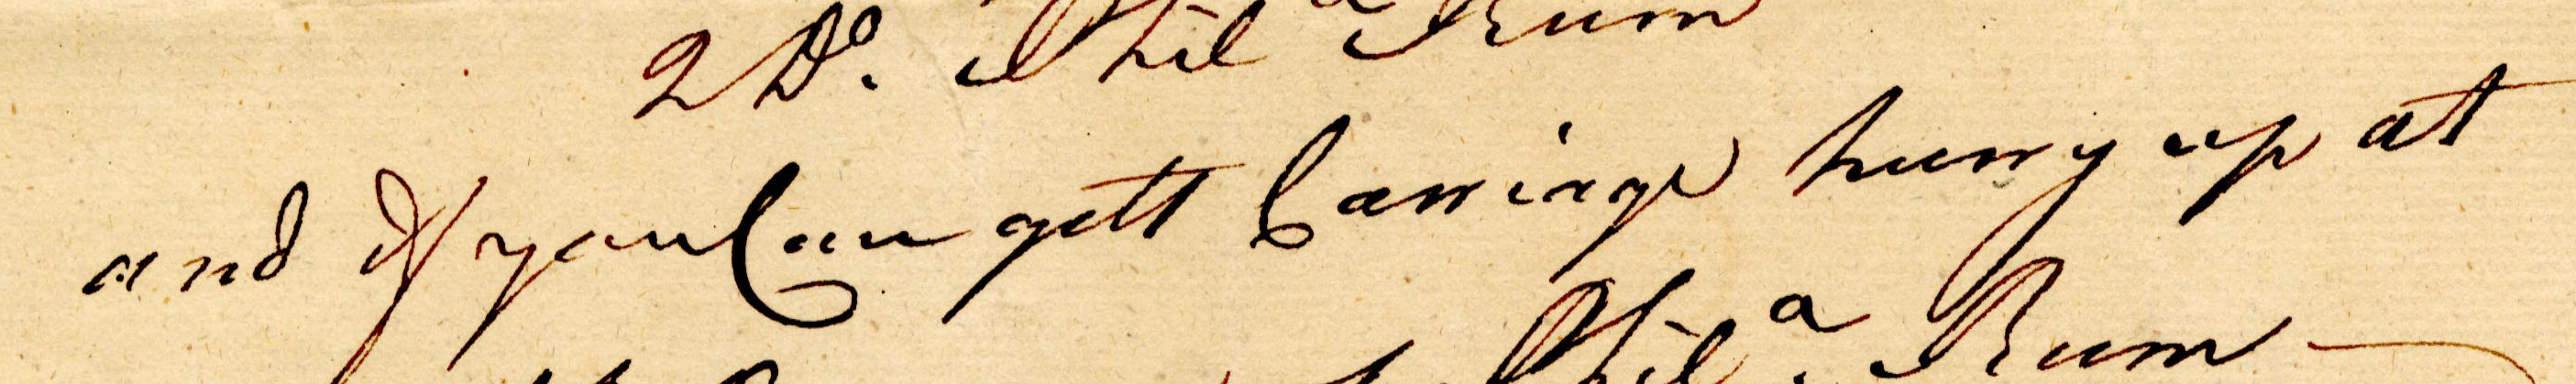and if your Can gett Carriage hurry up at
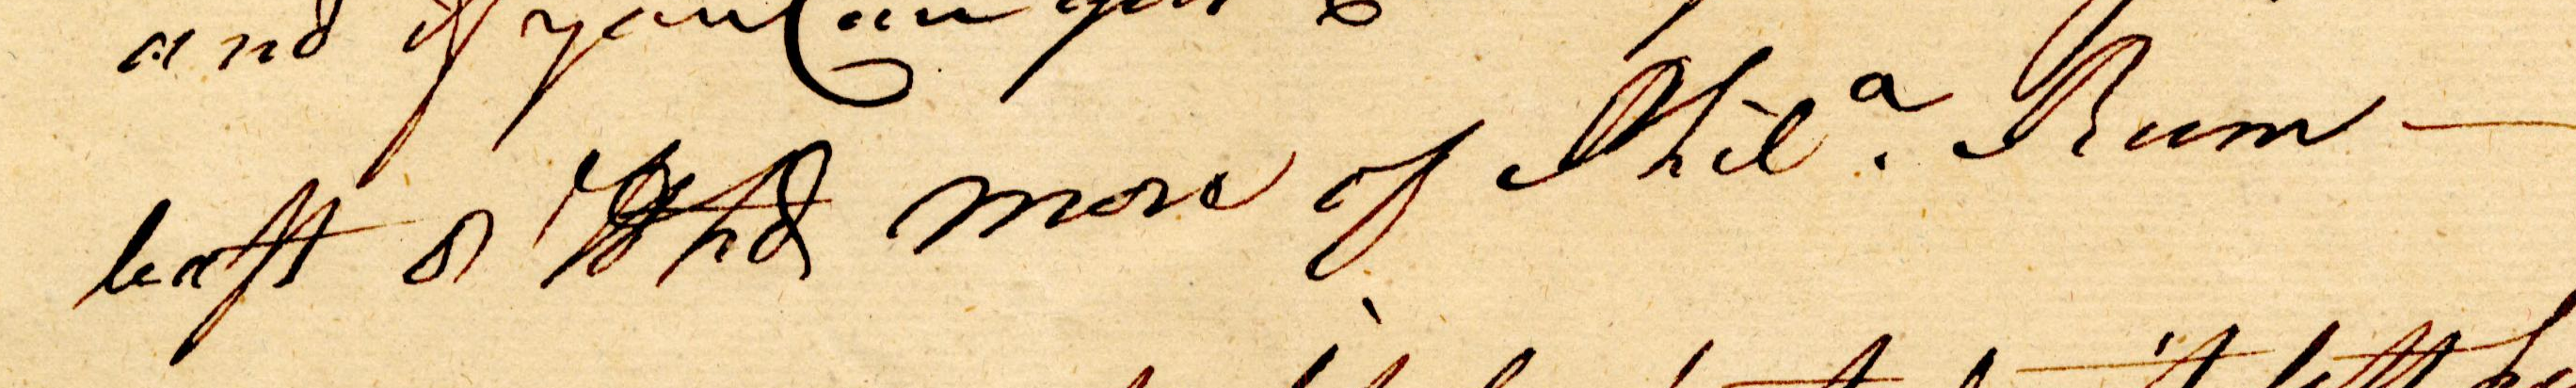last a Hhd more of Phil^a. Rum.-
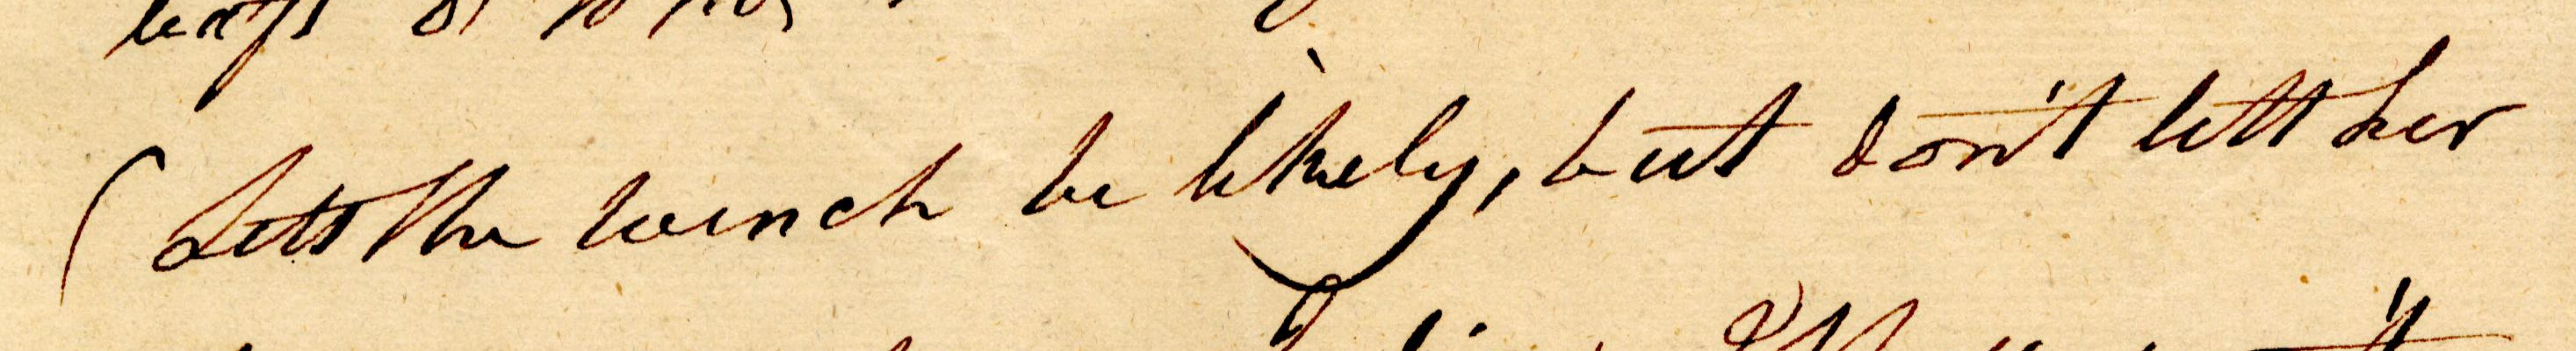(Lett the wench be likely, but dont lett her
